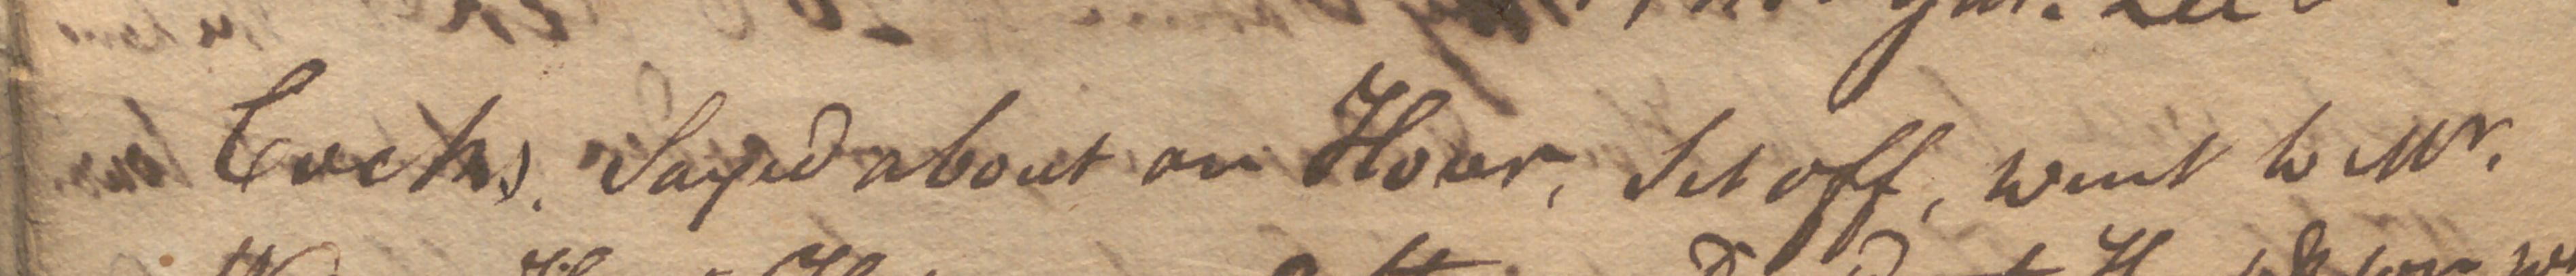Cocks, sayed about an Hour; set off went to M^r.
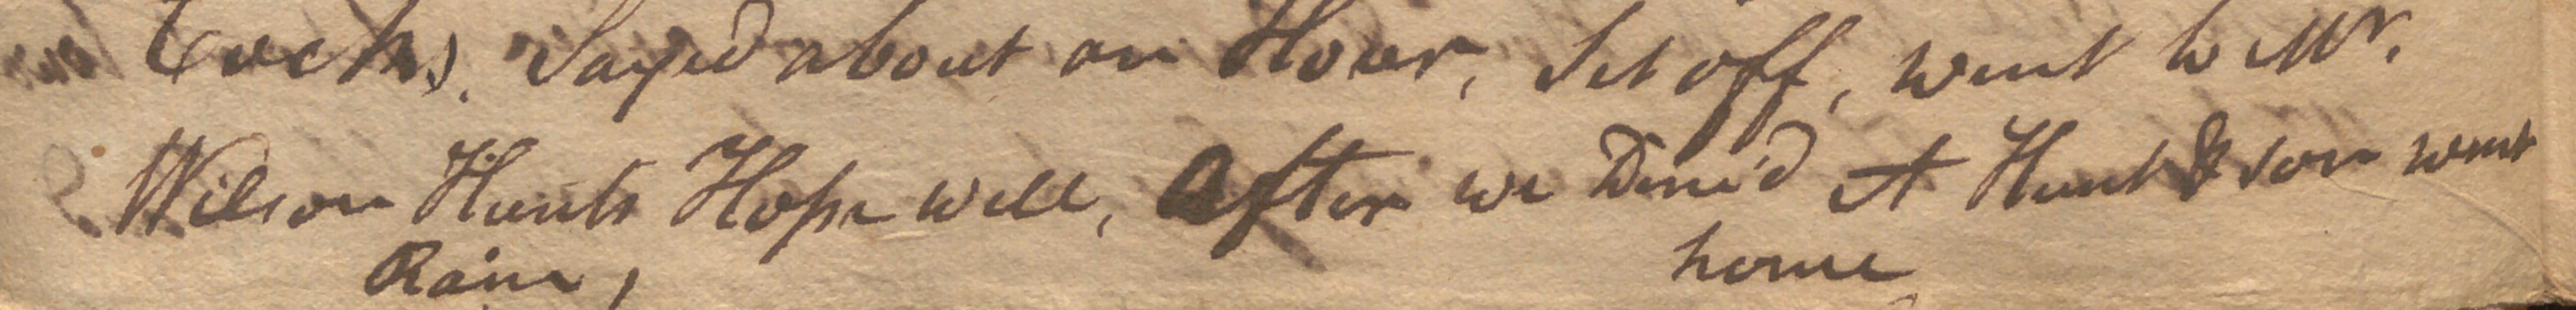Wilson Hunts Hopewell, After we Dine'd A Hunt & son went
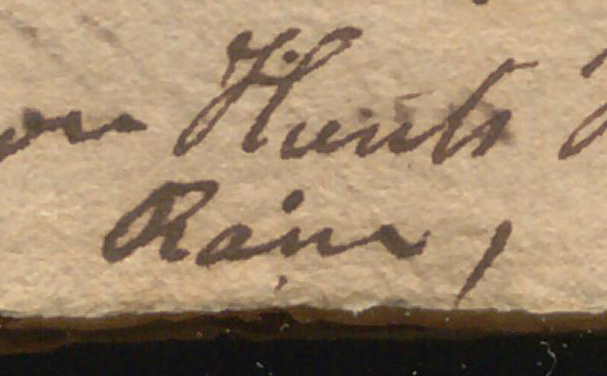Rain,
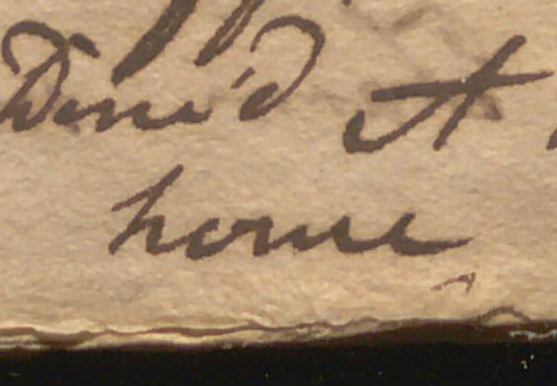home
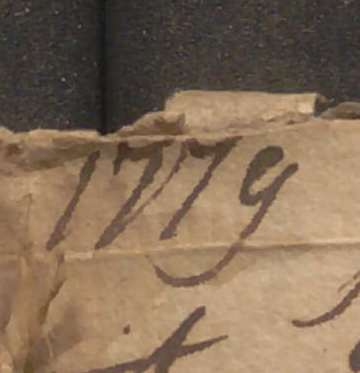1779
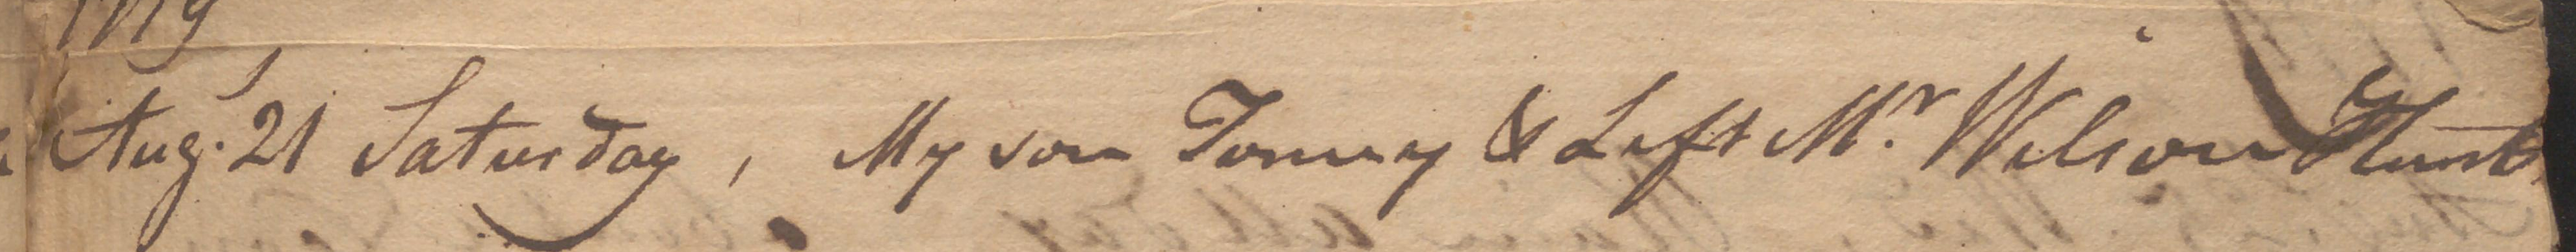Aug. 21 Saturday, My son Tomey & Left M^r. Wilson Hunt
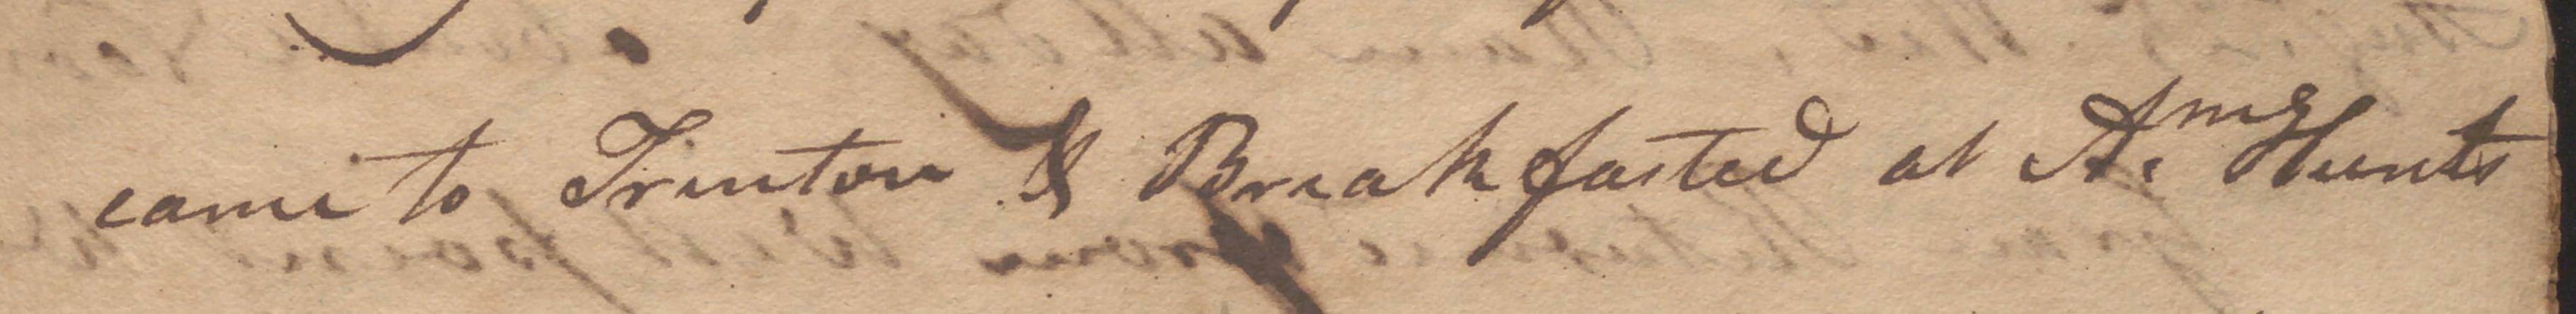came to Trenton & Breakfasted at A^m. Hunts
